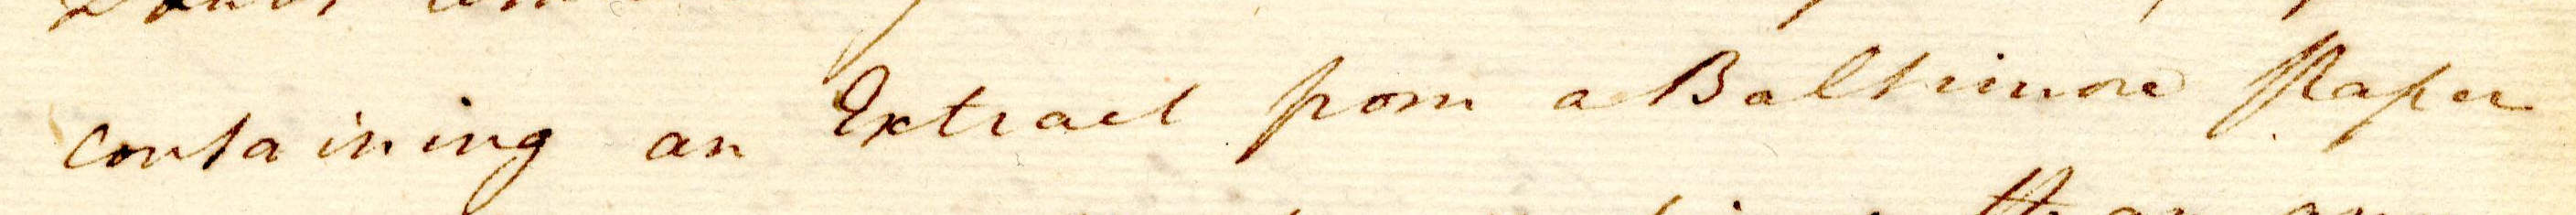containing an Extract from a Baltimore Paper
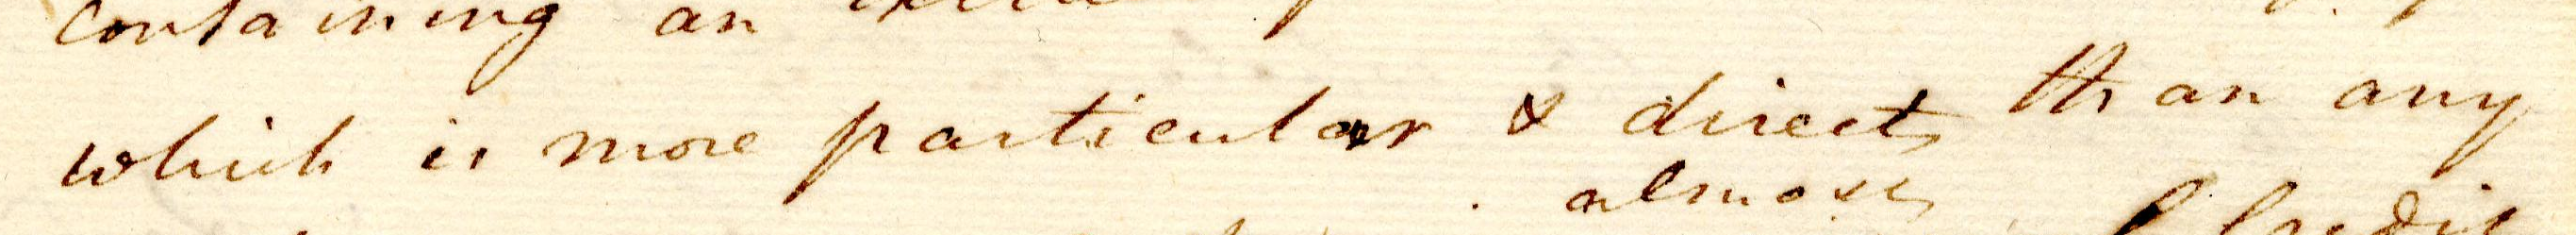which is more particutar & direct than any
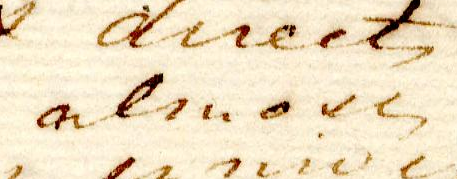almost
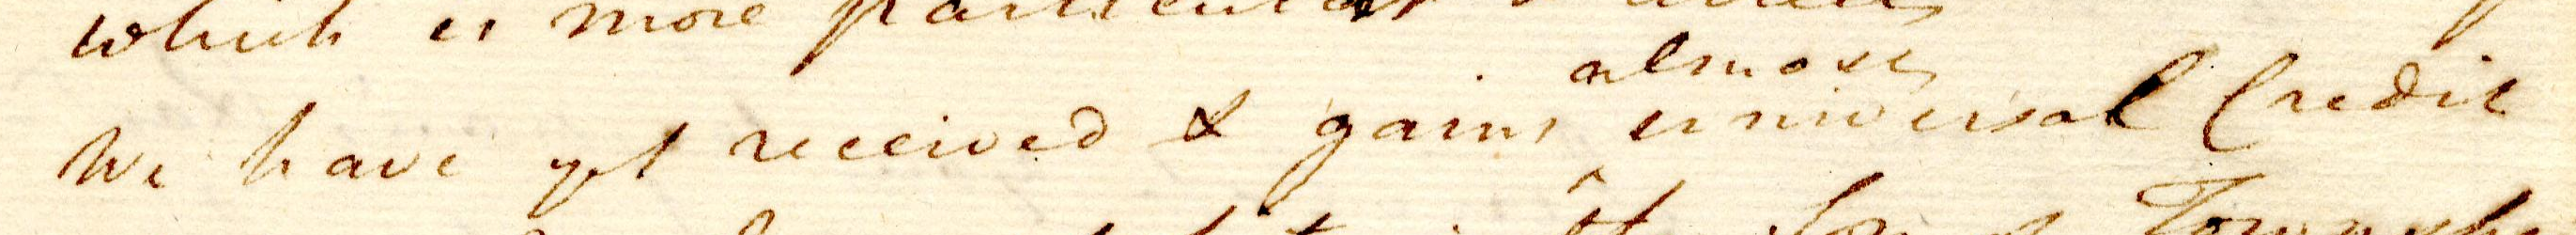we have yet received & gains universal Credit
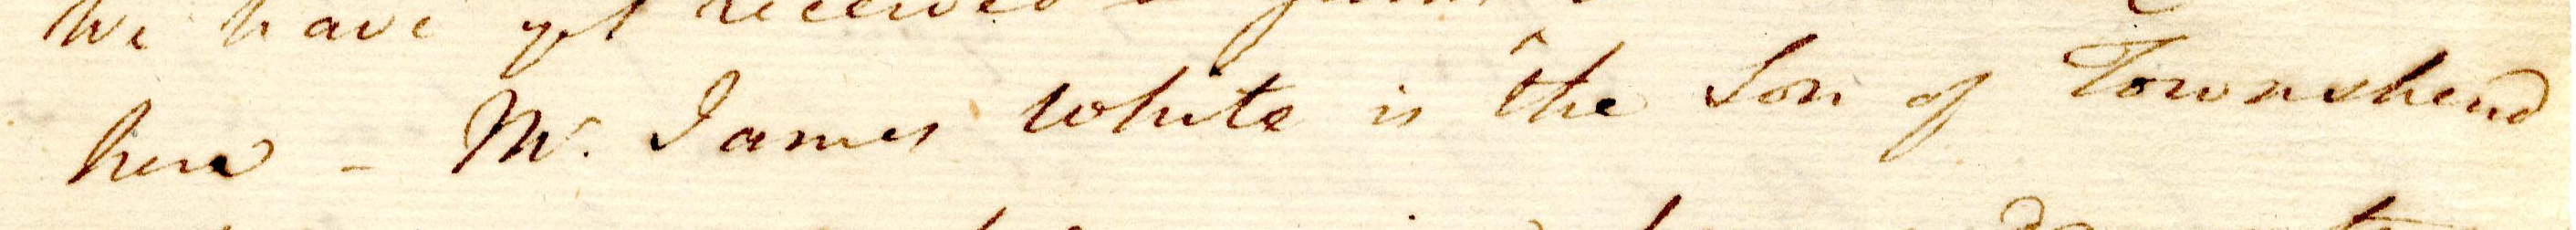here. M^r. James White is the Son of Townshend
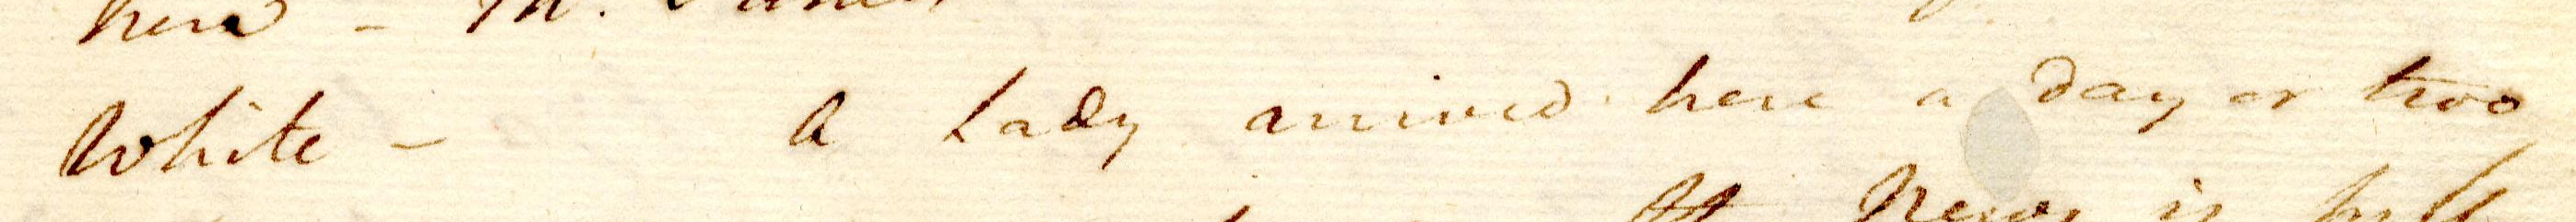white. A lady arived here a day or two
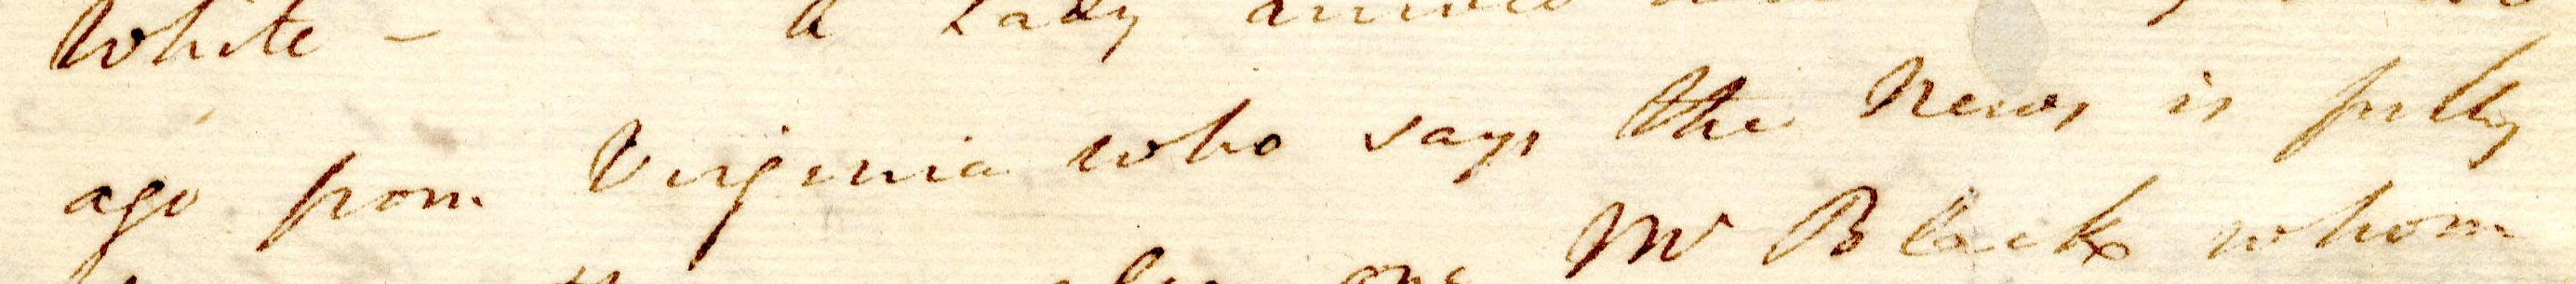ago from Virginia who says the News is fairly
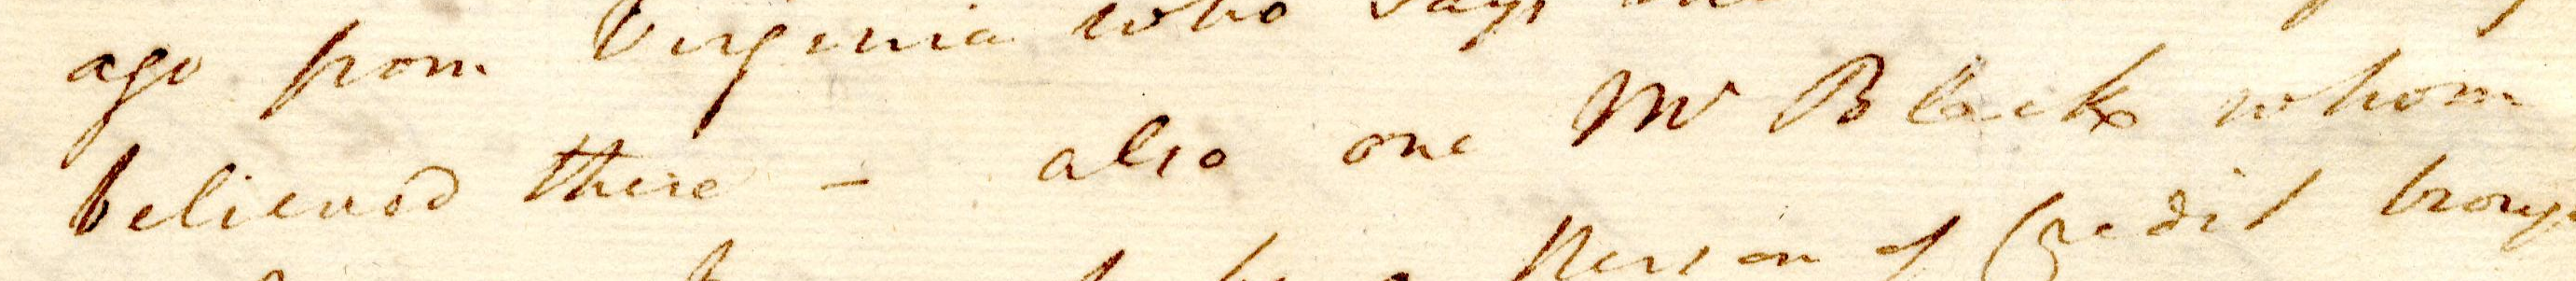believed there. also one M^r Black whom
